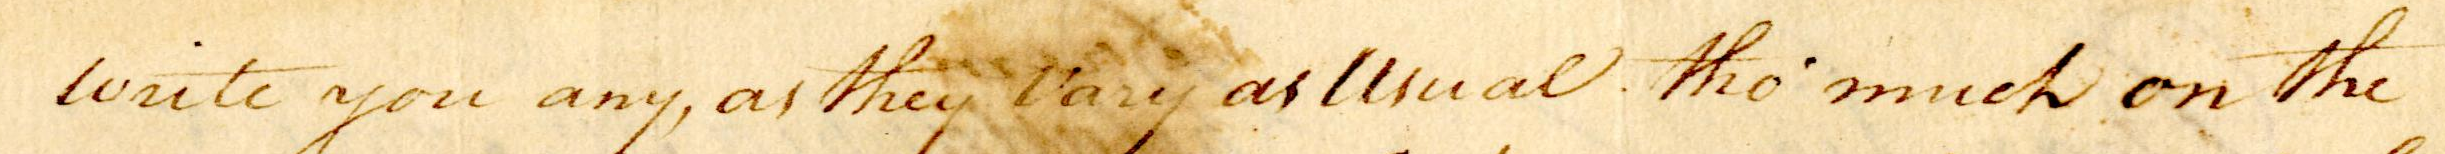write you any, as they Vary as Usual tho' much on the
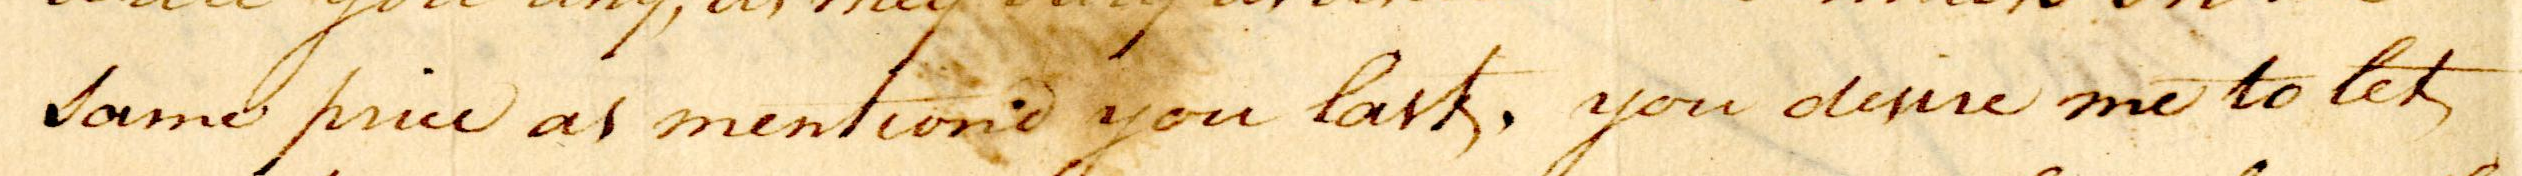Same price as mention'd you last, you desire me to let,
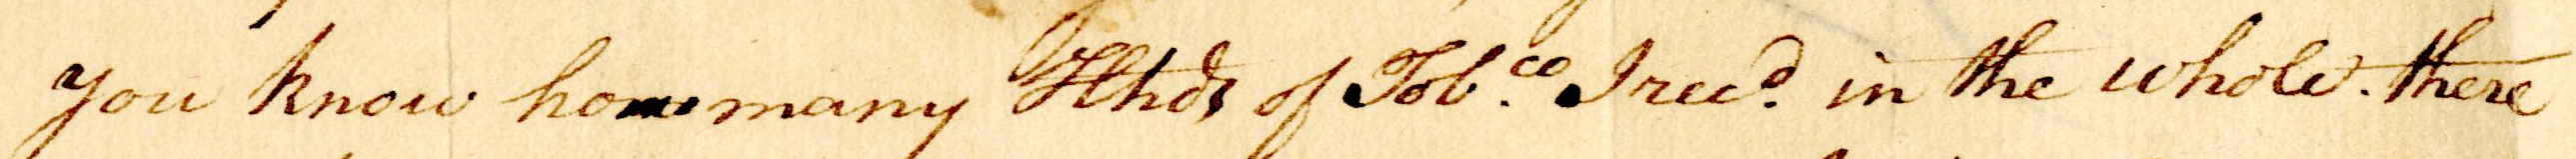you know how many Hhds of Tob^co. I rec^d. in the whole there
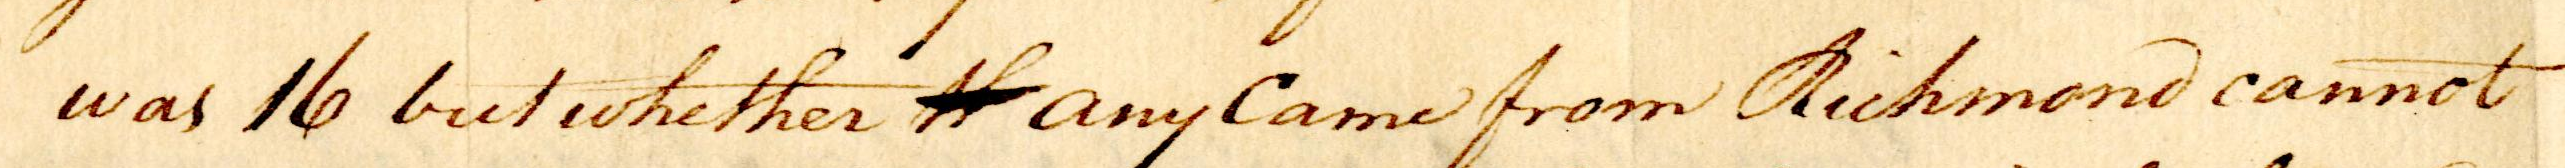was 16 but whether [_] any Came from Richmond cannot
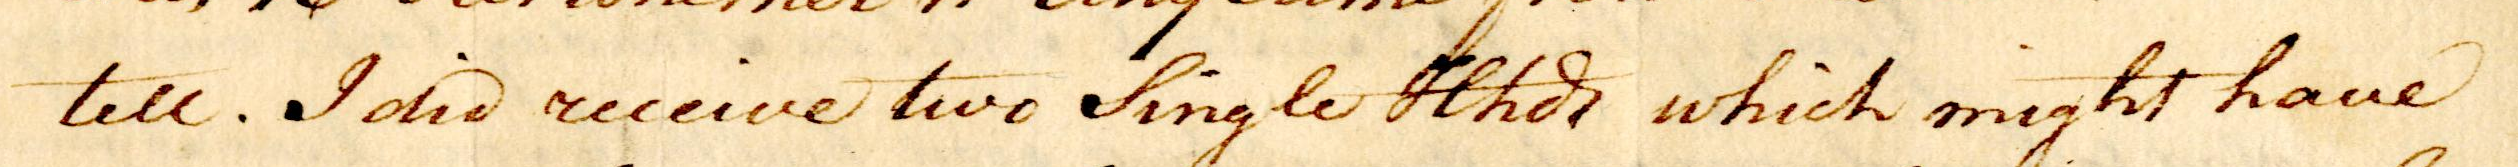tell. I did receive two Single Hhds which might have
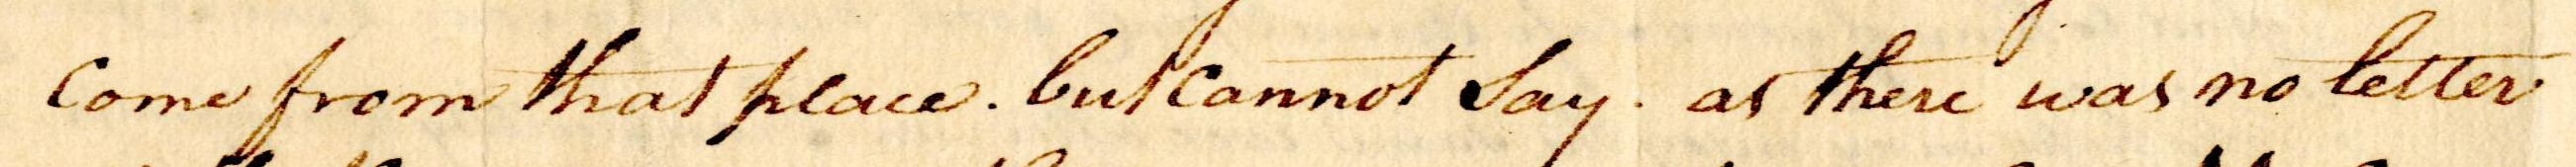Come from that place. but Cannot Say. as there was no letter
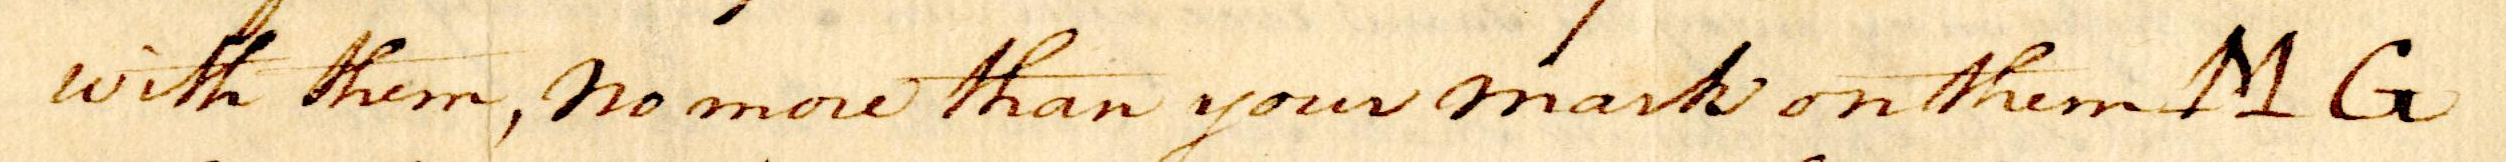with them, no more than your mark on them M G
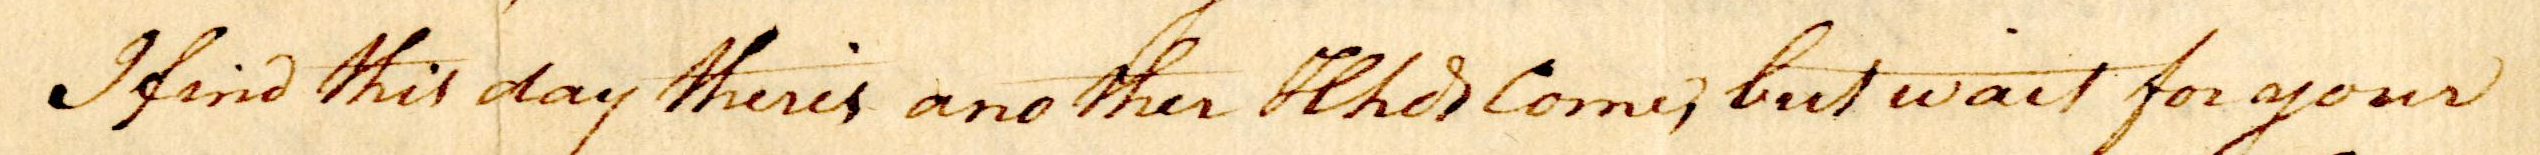I find this day there's another Hhd come, but wait for your
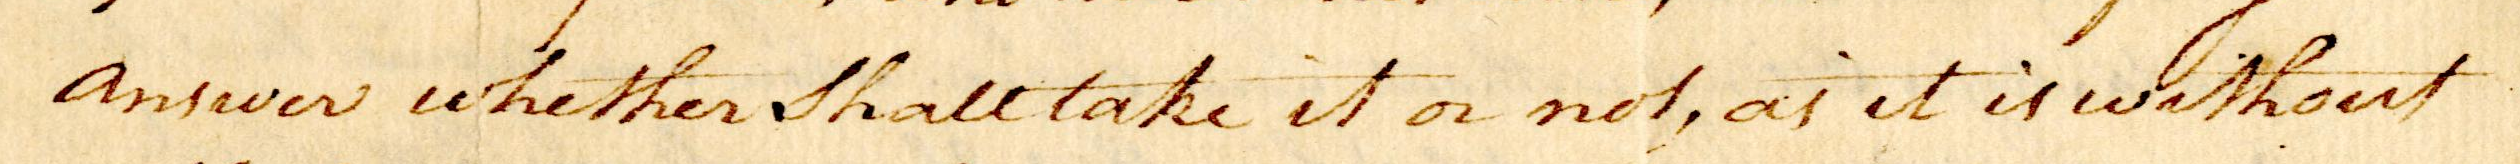answer whether shall take it or not, as it is without
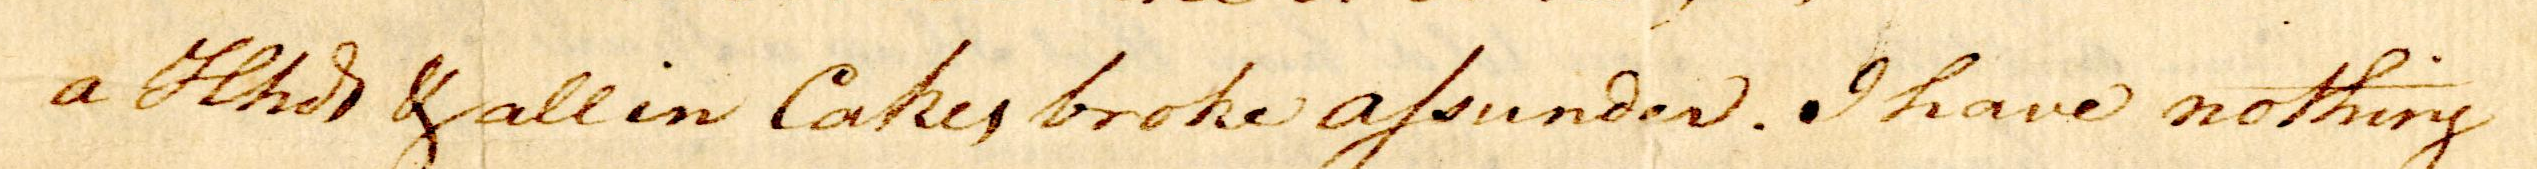a Hhd & all in Cakes broke asunder I have nothing
